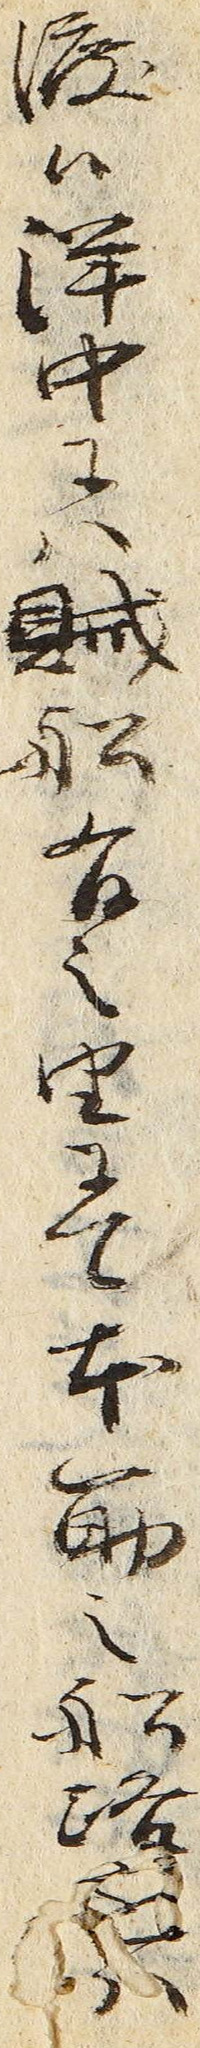渡候洋中には賊船有之由にて本筋之船路をは
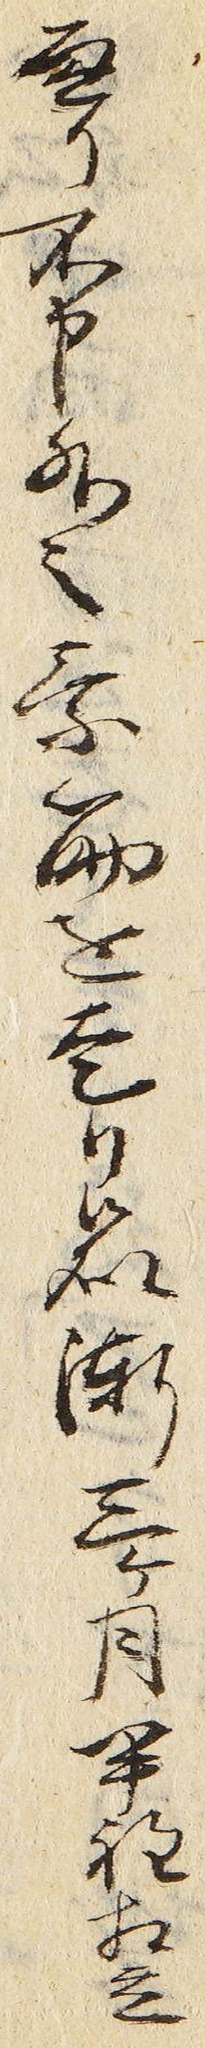通り不申外之乗筋を走り候処漸三ヶ月半程相立
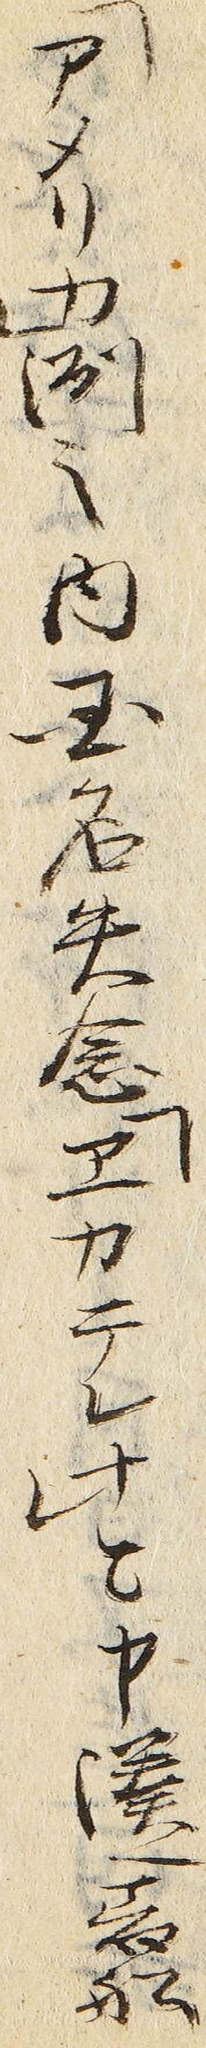「アメリカ」洲之内国名失念「ヱカテレナ」と申湊へ着船
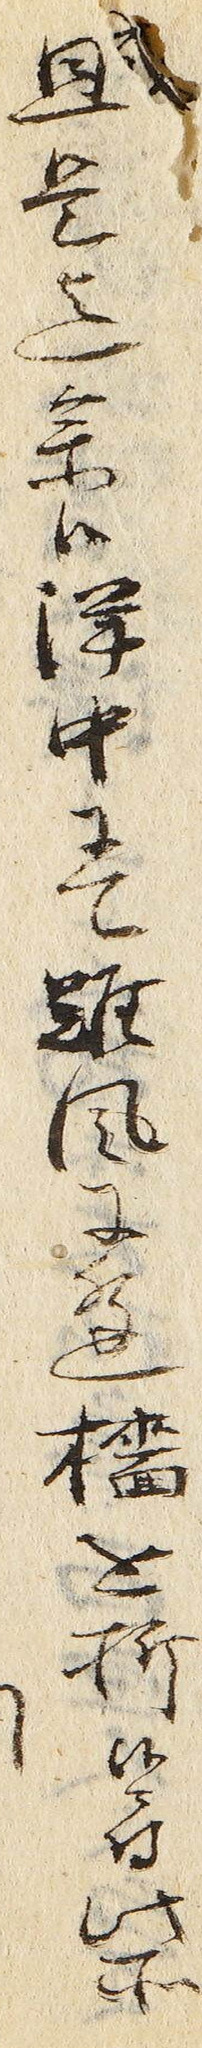且是迄参候洋中にて難風に逢檣を折候に付此所
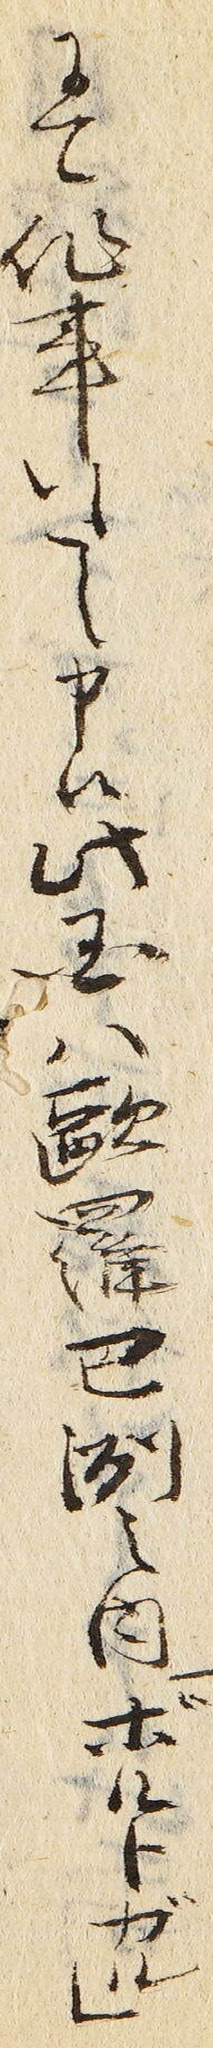にて作事いたし申候此国は欧羅巴洲之内「ボルトガル」
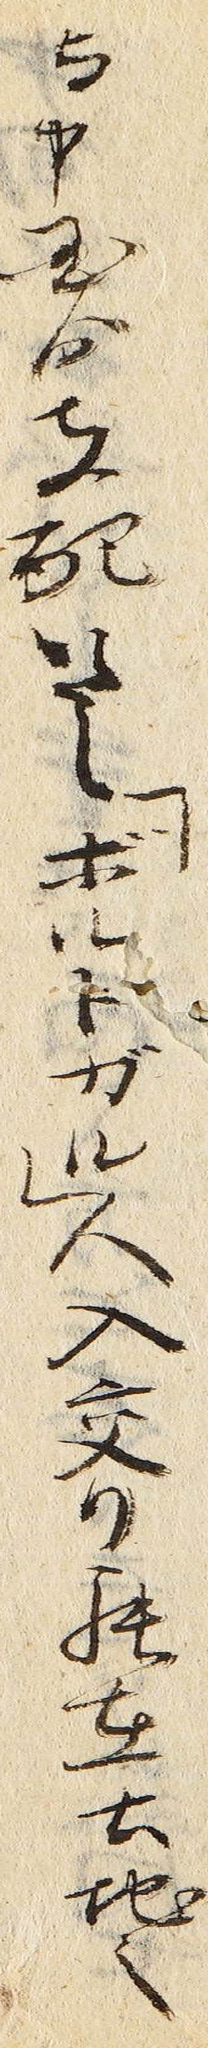と申国ゟ支配いたし「ボルトガル」人入交り罷在土地之
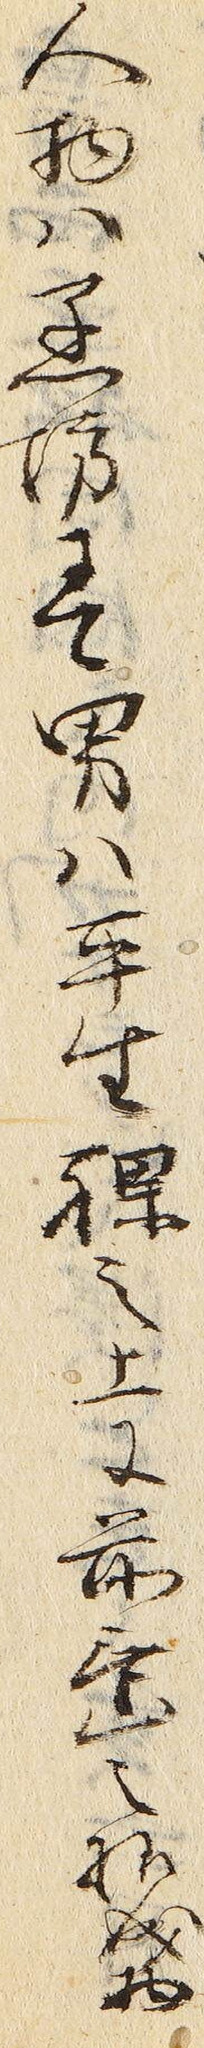人物は黒坊にて男は平生裸之上に前垂之様成物
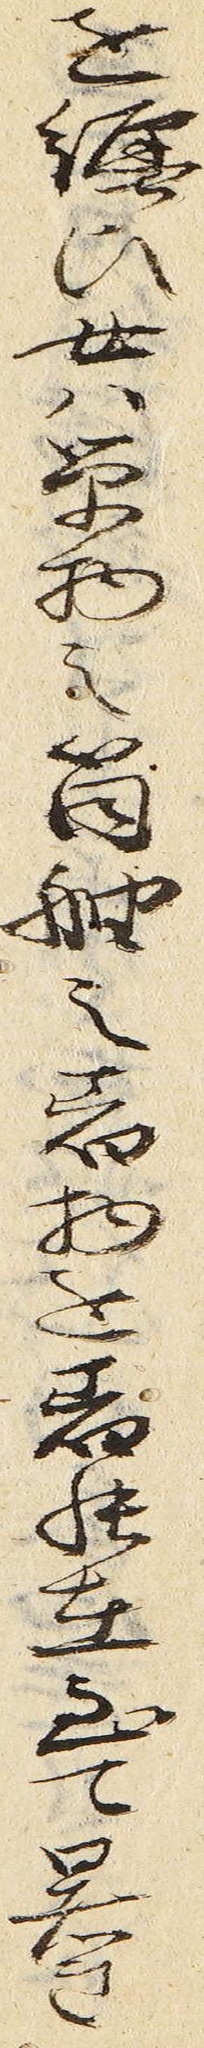を纏ひ女は単物之筒袖之着物を着罷在至て暑き
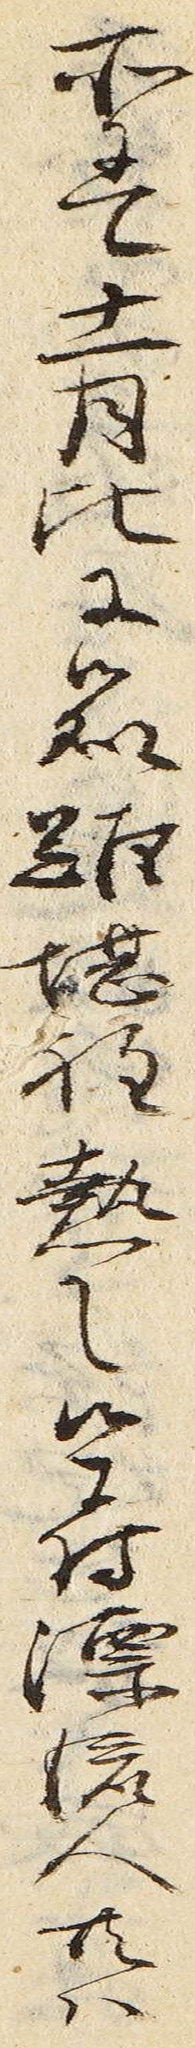所にて十一月比に候処難堪程熱し候に付漂流人共は
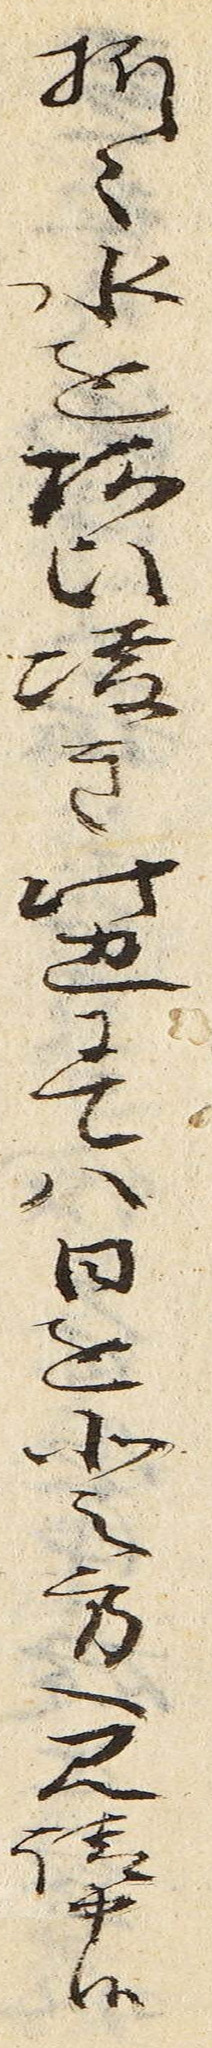折々水をあひ凌き此辺にては日を北之方へ見請申候
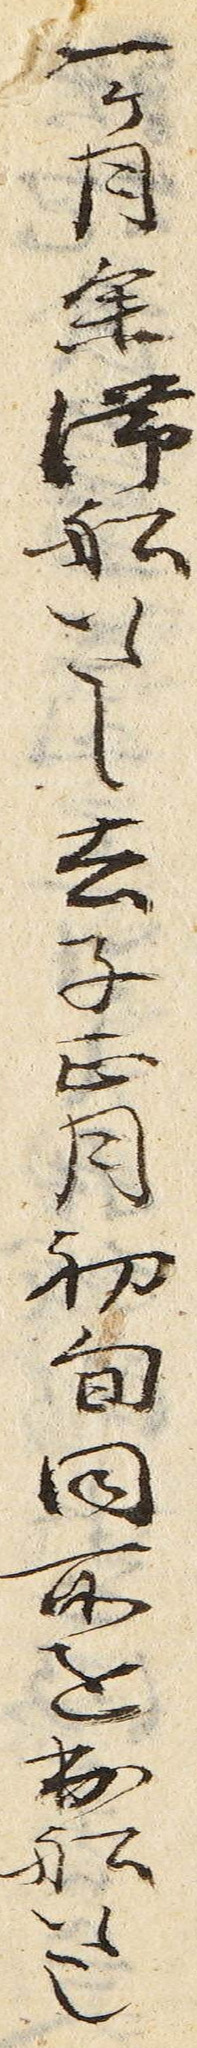一ヶ月余滞船いたし去子正月初旬同所を出船いたし
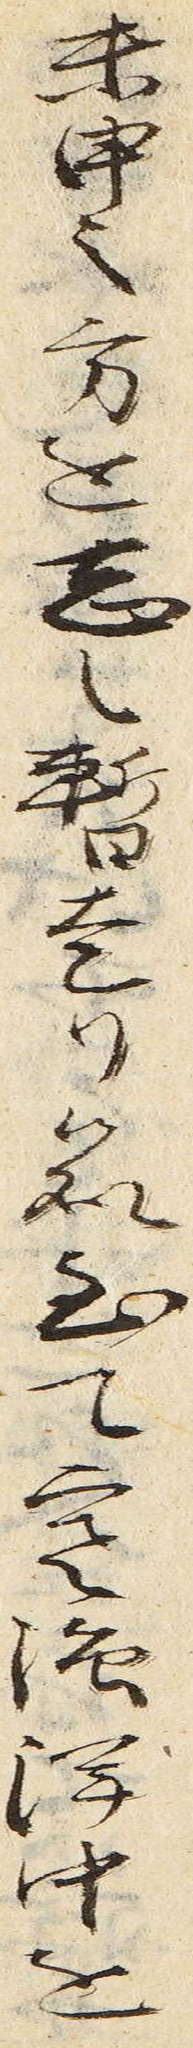未申之方を志し暫走り候処至て寒強洋中を
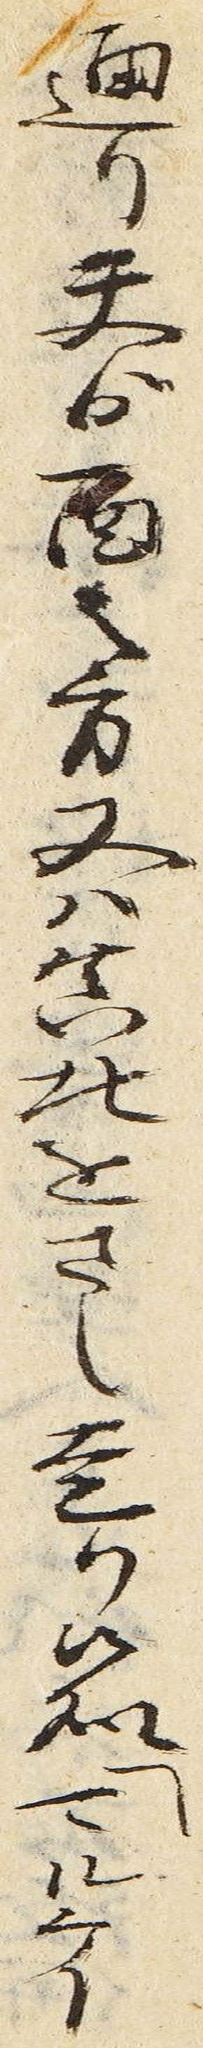通り夫ゟ酉之方又は真北をさし走り候処「マルケー
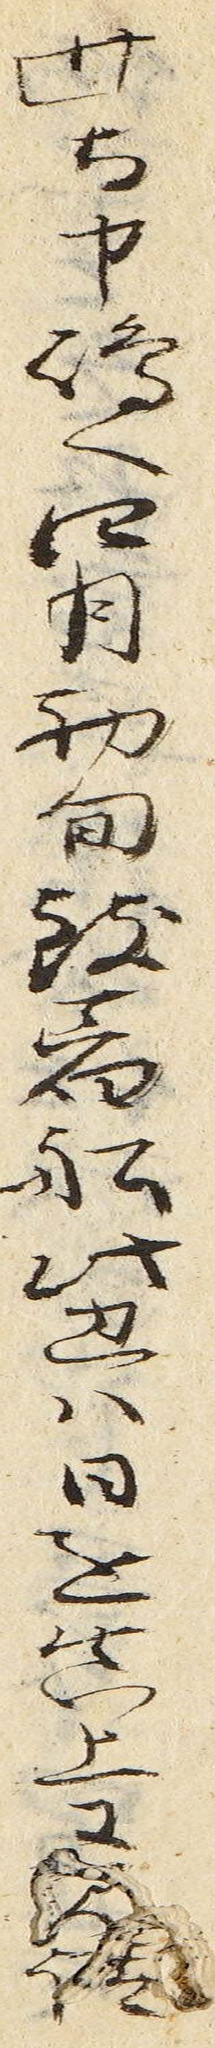サ」と申島へ四月初旬致着船此辺は日を真上に見請
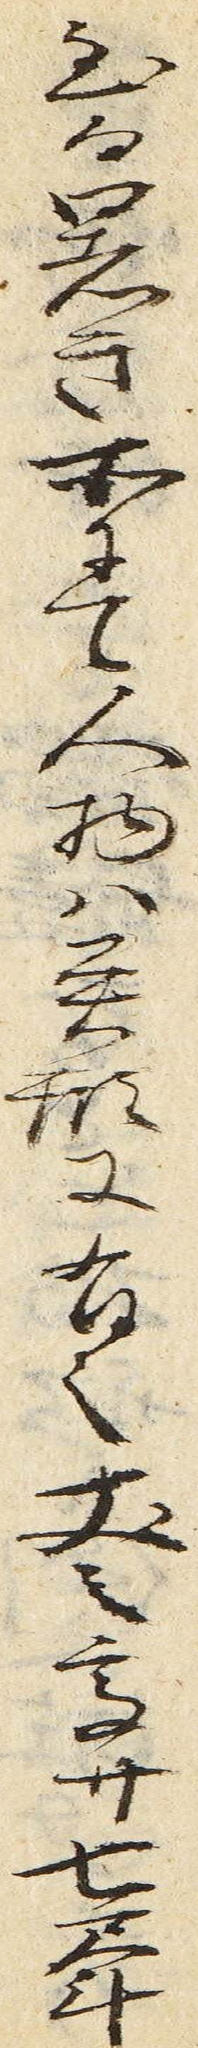至て暑き所にて人物は異形に有之丈之高サ七尺斗
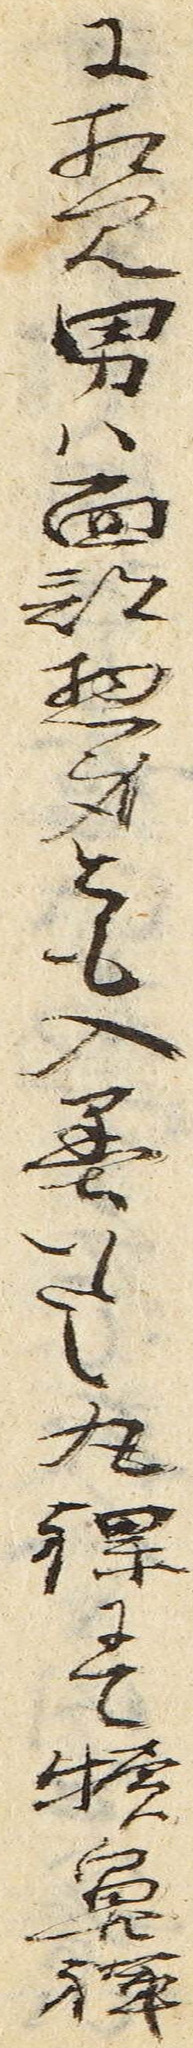に相見男は面部惣身とも入墨いたし丸裸にて犢鼻褌
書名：漂民後記
